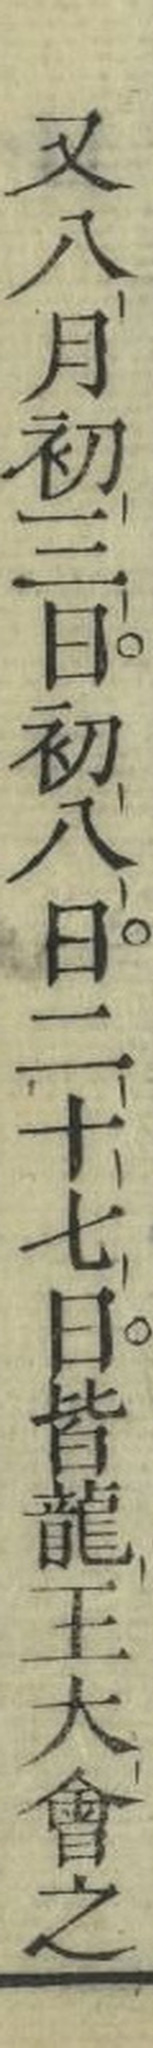又八-月初-三-日。初-八-日。二-十-七-日。皆龍-王大-會之

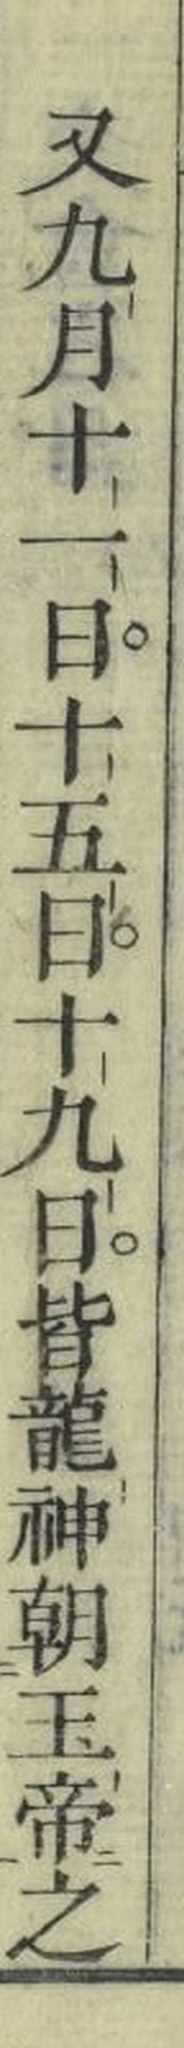又九-月十-一-日。十-五-日。十-九-日。皆龍-神朝玉-帝之
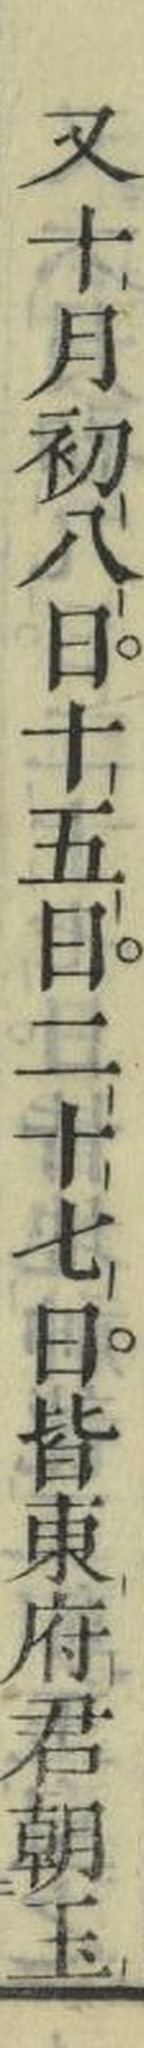又十-月初-八-日。十-五-日。二-十-七-日。皆東-府-君朝玉-

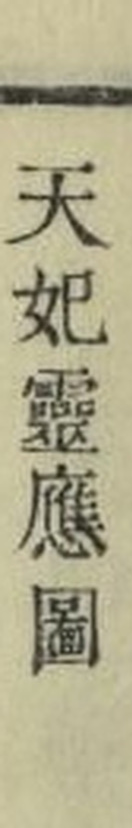天妃靈應圖

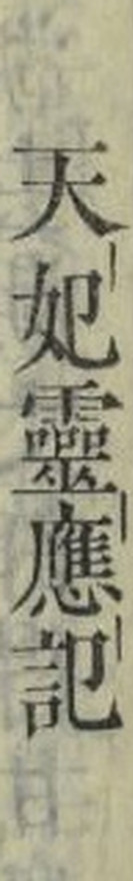天-妃靈-應-記

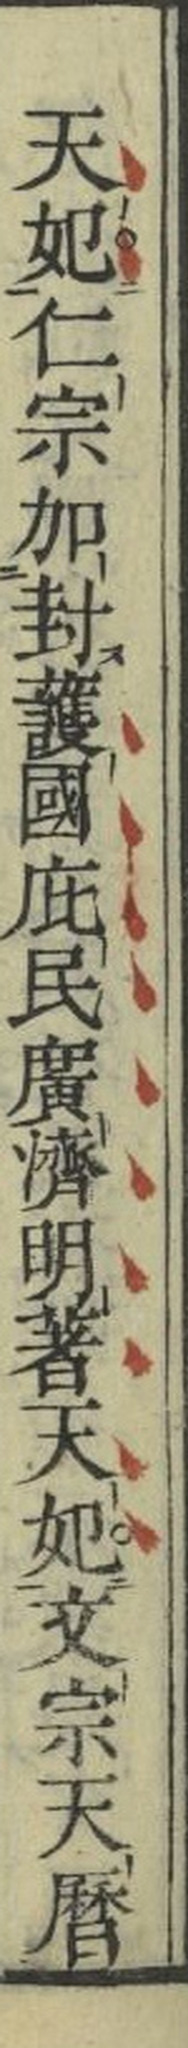天-妃。仁-宗加-封䕶-國庇-民廣-濟明-著天-妃。文-宗天-曆
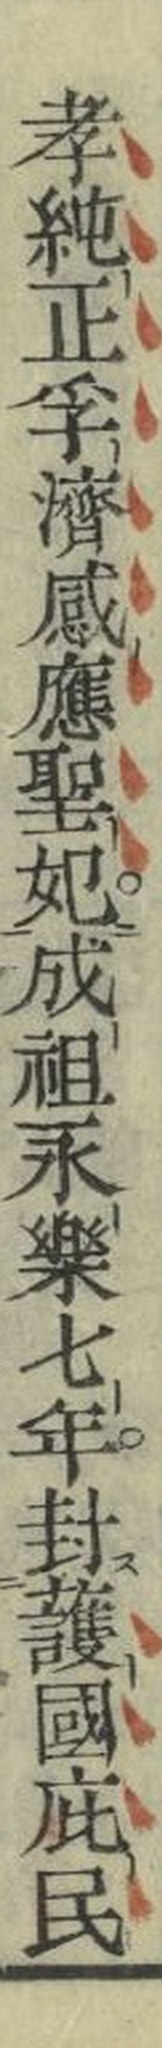孝純-正孚-濟感-應聖-妃。成-祖永-樂七-年。封䕶-國庇-民

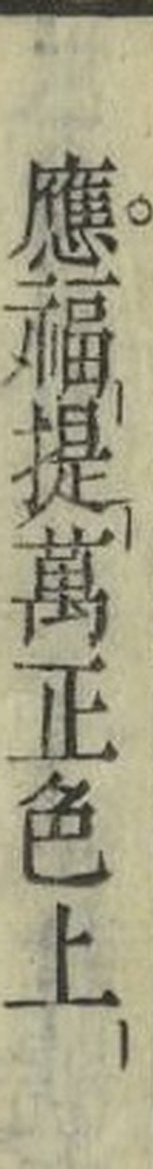應。福-提-萬正色上-
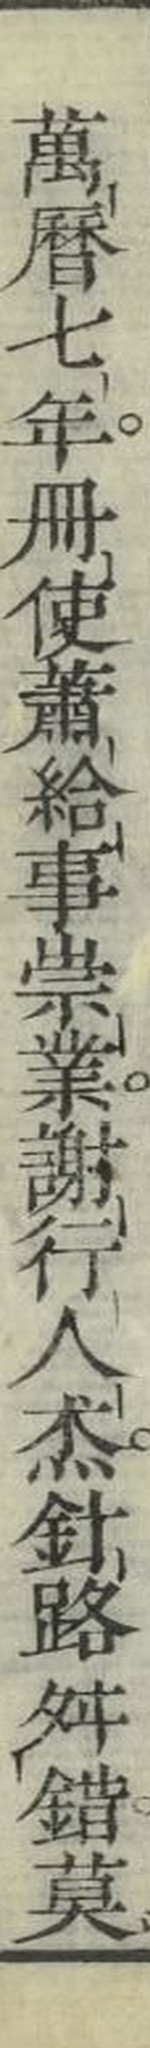萬-曆七-年。冊-使蕭-給-事崇-業。謝-行-人-然。針-路舛-錯。莫

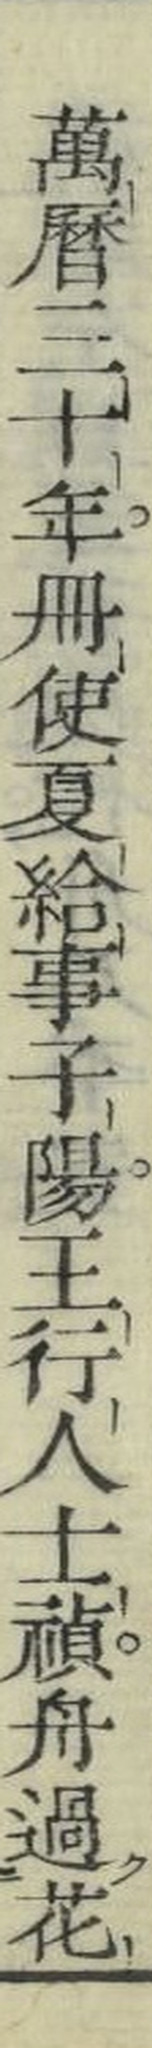萬-曆三-十-年。冊-使夏-給-事子-陽。王-行-人士-禎。舟過花-
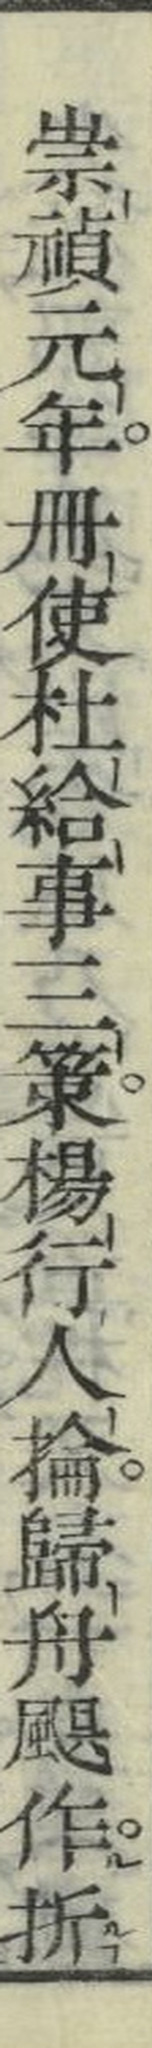崇-禎元-年。冊-使杜-給-事三-策。楊-行-人-掄。歸-舟颶-作。折ヿ
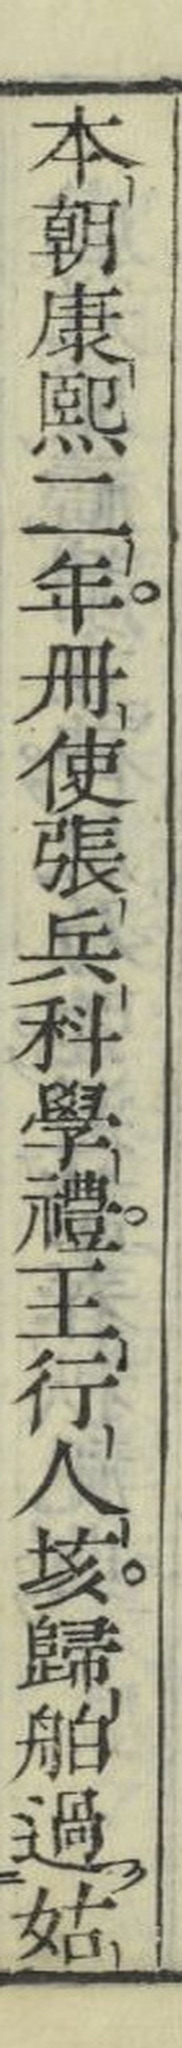本-朝康-熙二-年。冊-使張-兵-科學-禮。王-行-人-垓。歸-舶過姑-
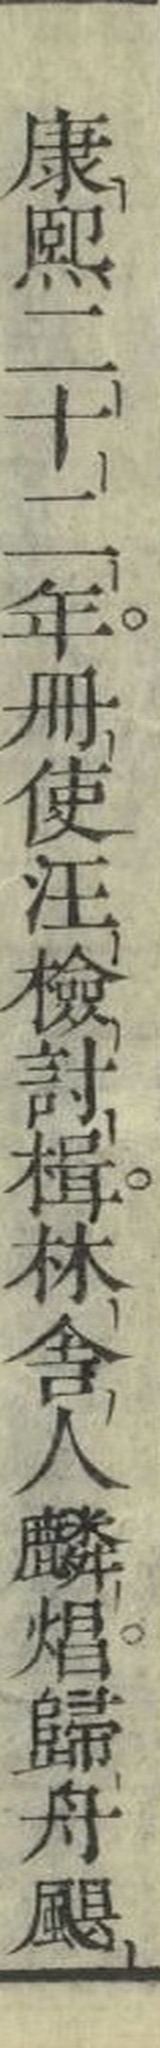康-熙二-十-二-年。冊-使汪-檢-討-楫。林-舎-人麟-焻。歸-舟颶-
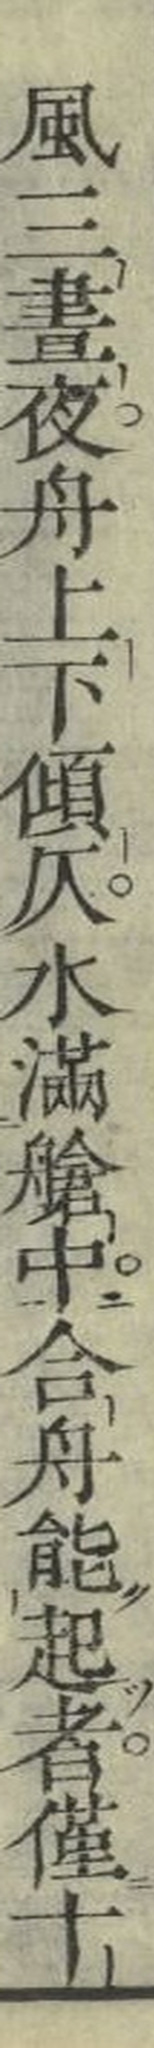風三-晝-夜。舟上-下傾-仄。水滿艙-中。合-舟能-起者。僅十-

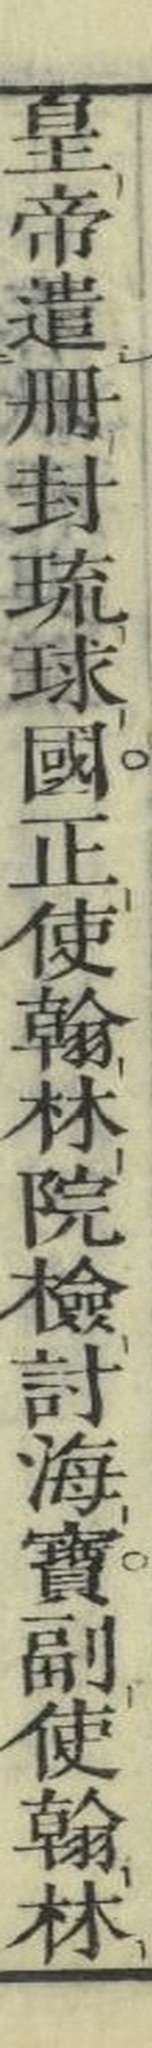皇-帝遣冊封琉-球-國。正-使翰-林-院檢-討海-寶。副-使翰-林-
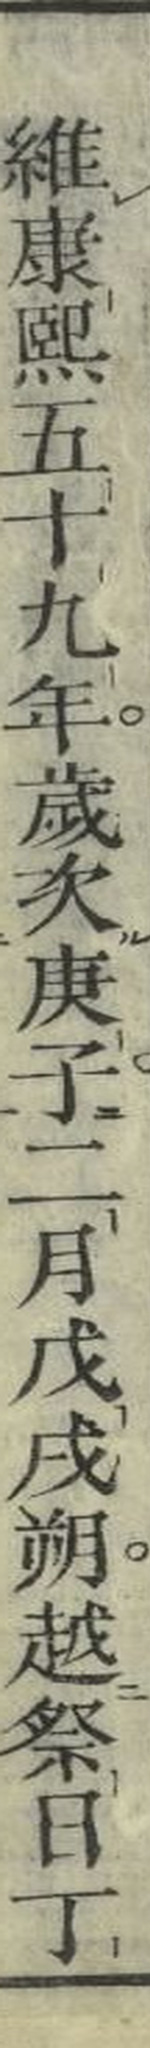維康-熙五-十-九-年。歲次庚-子。二-月戊-戌朔。越祭-日丁-
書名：中山伝信録 巻一
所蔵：University of the Ryukyus Library
